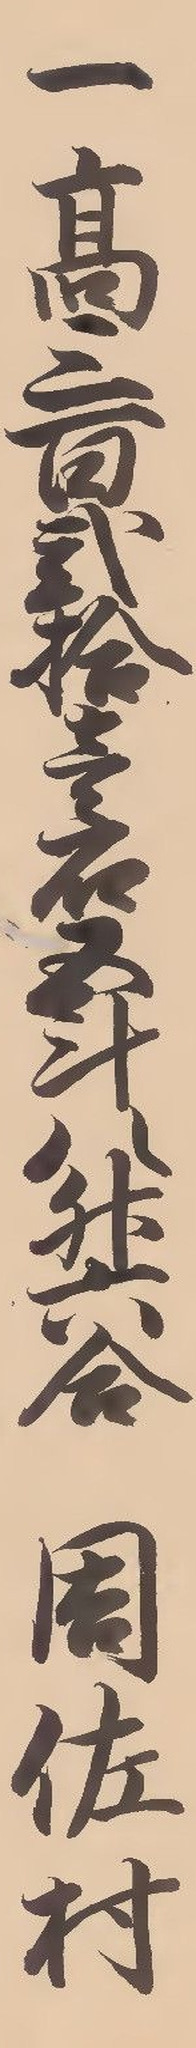一高三百弐拾壱石五斗八升六合周佐村
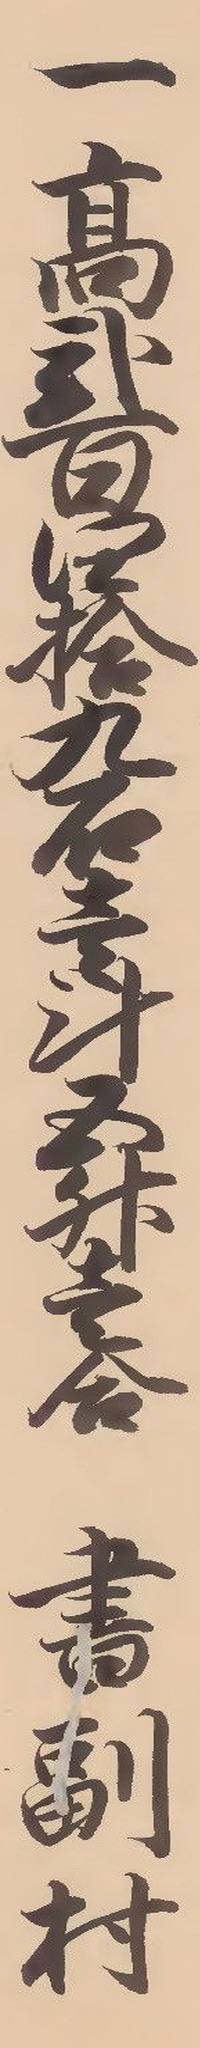一高弐百四拾九石壱斗五升壱合書副村
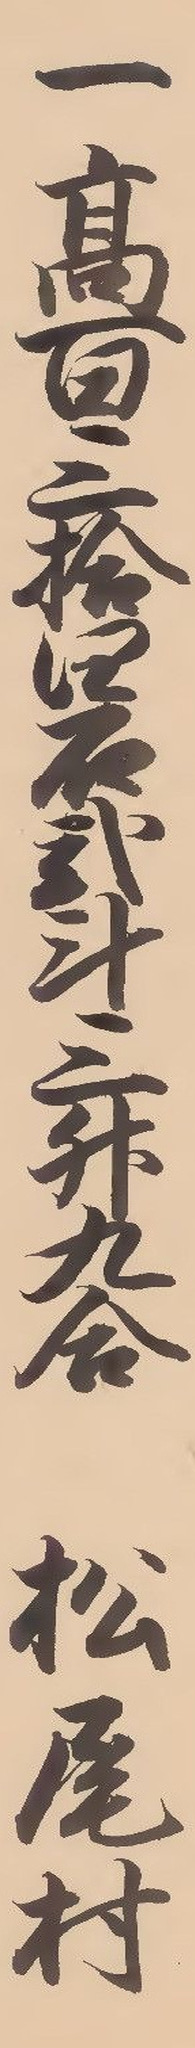一高百三拾四石弐斗三升九合松尾村
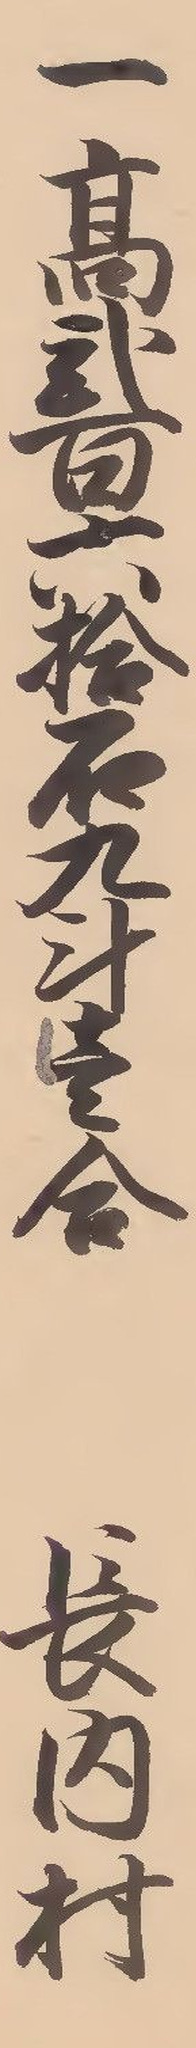一高弐百六拾石九斗壱合長内村

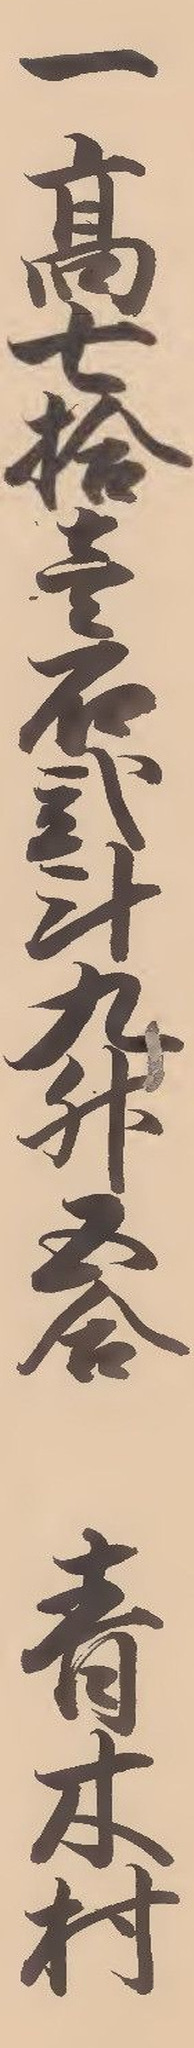一高七拾壱石弐斗九升五合青木村
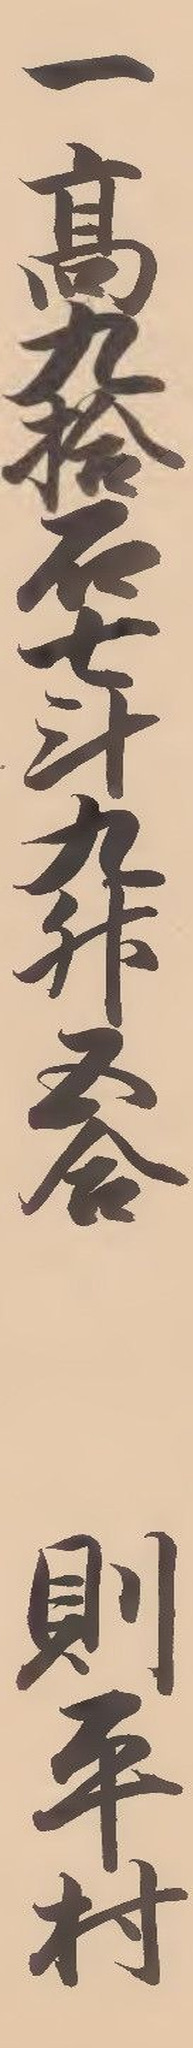一高九拾石七斗九升五合則平村
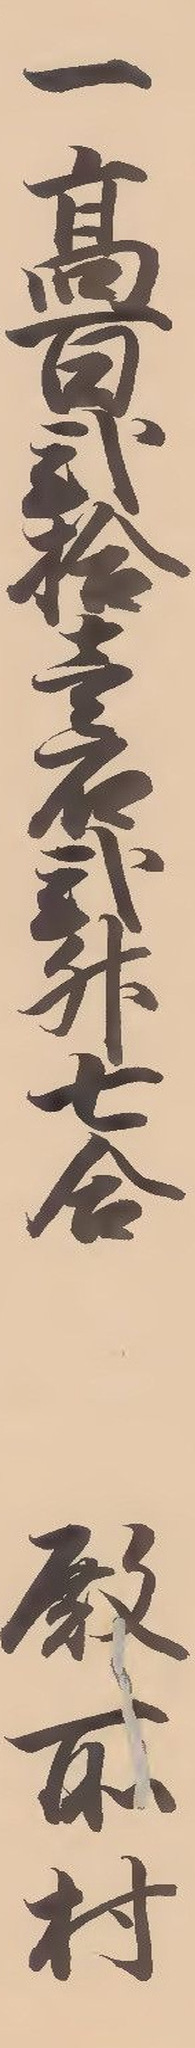一高百弐拾壱石弐升七合殿所村
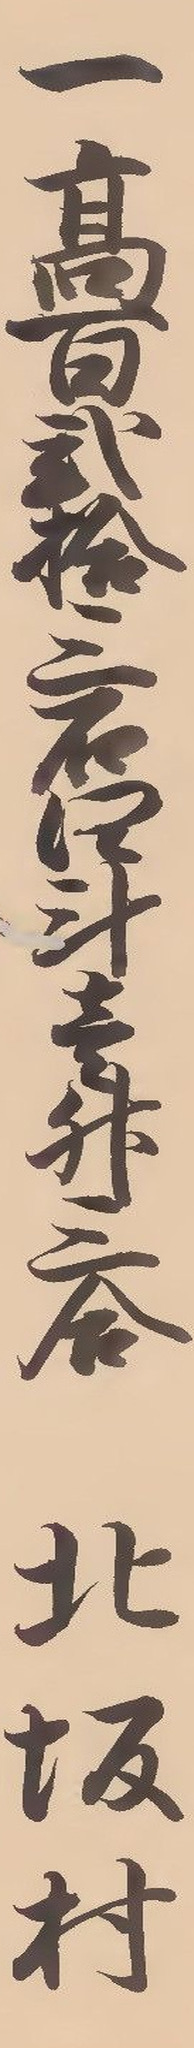一高百弐拾三石四斗壱升三合北坂村
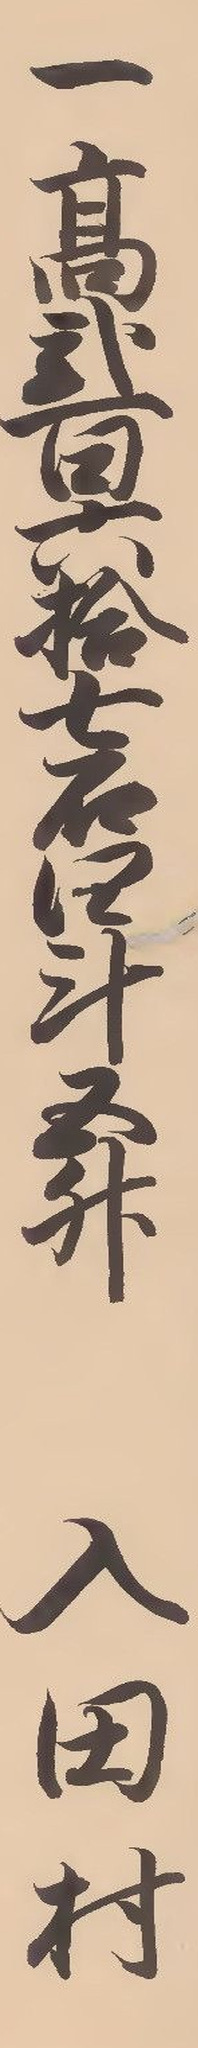一高弐百六拾七石四斗五升入田村
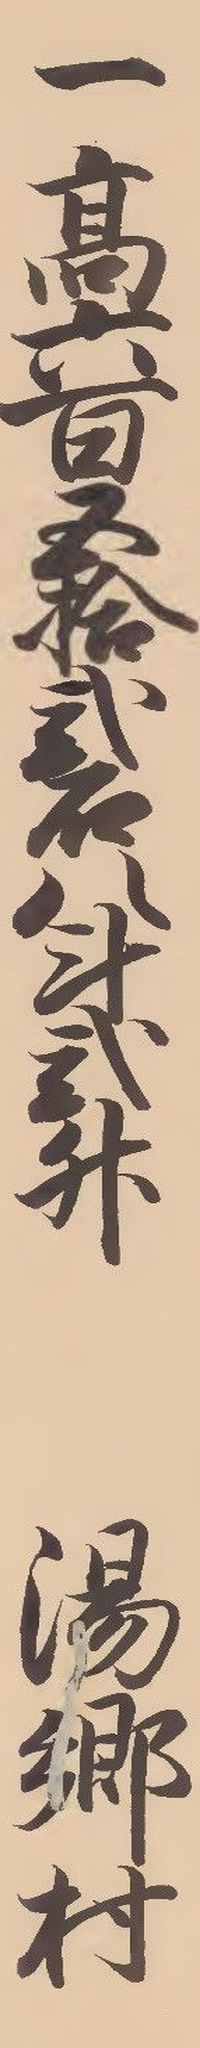一高六百五拾弐石八斗弐升湯郷村
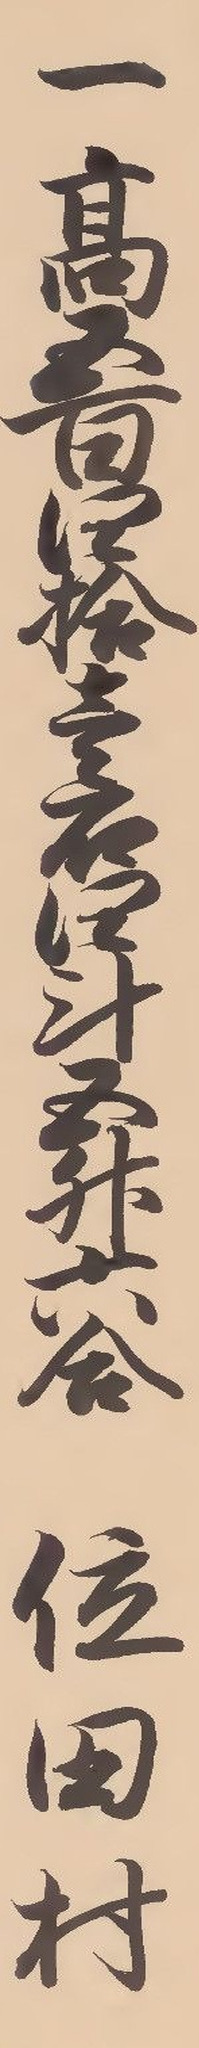一高五百四拾壱石四斗五升六合位田村
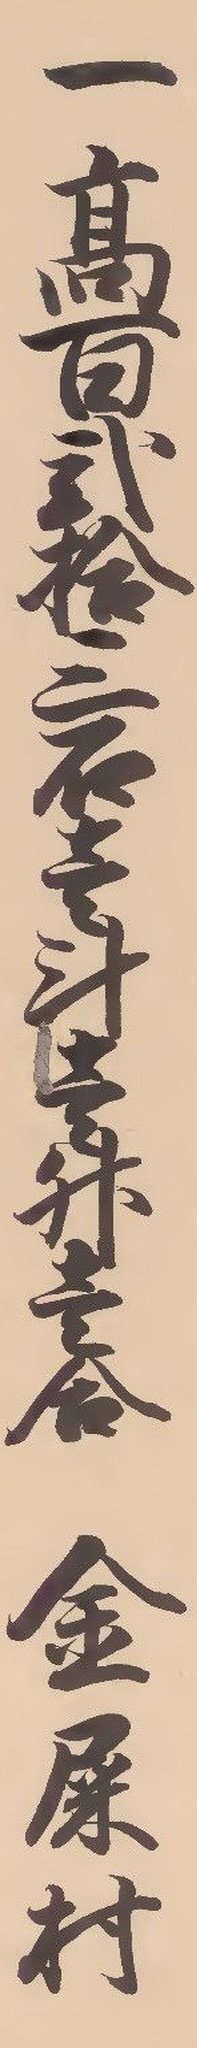一高百弐拾三石壱斗壱升壱合金屎村

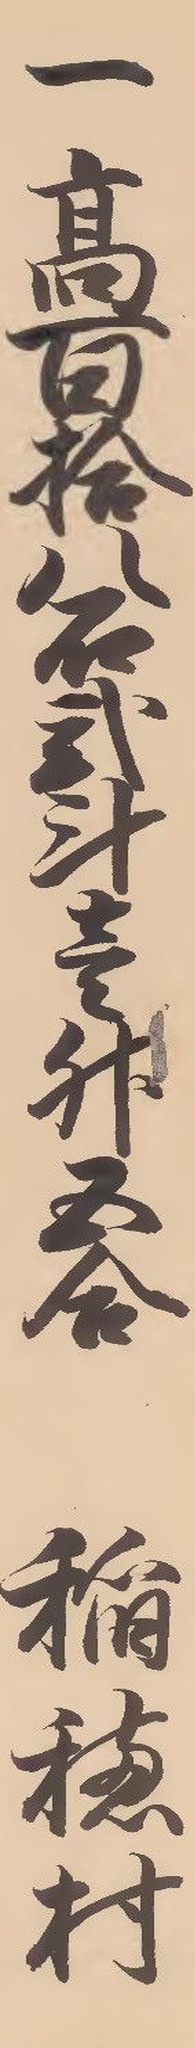一高百拾八石弐斗壱升五合稲穂村
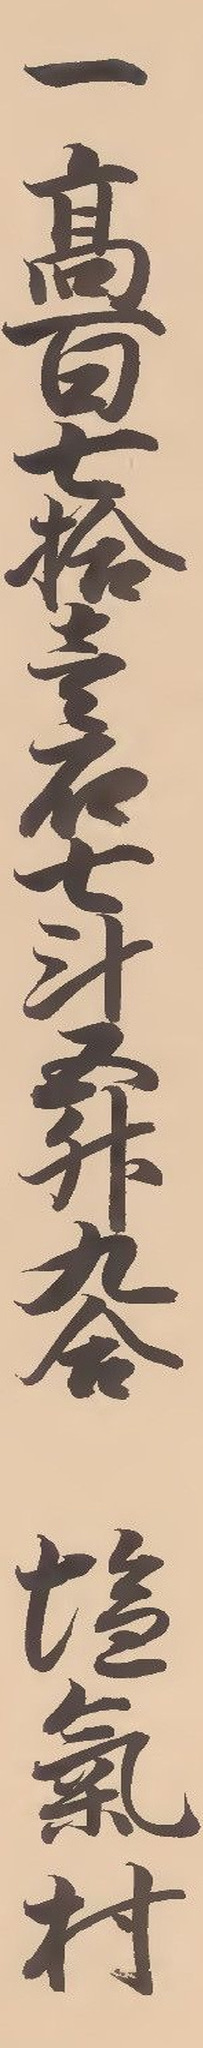一高百七拾壱石七斗五升九合塩気村
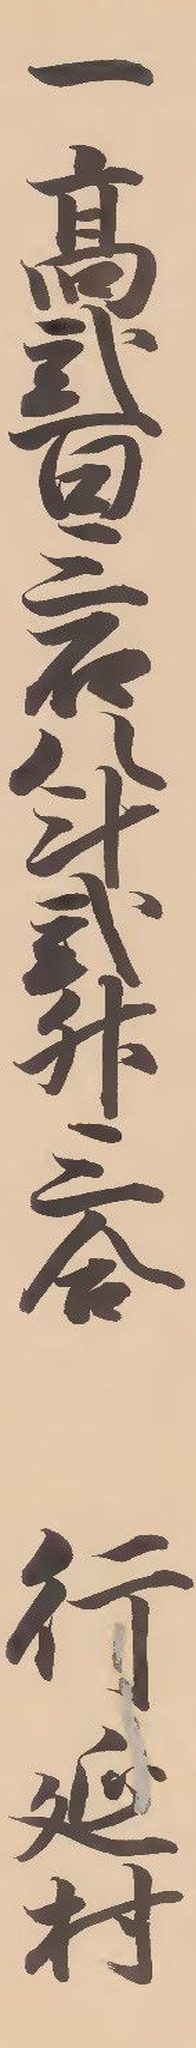一高弐百三石八斗弐升三合行延村
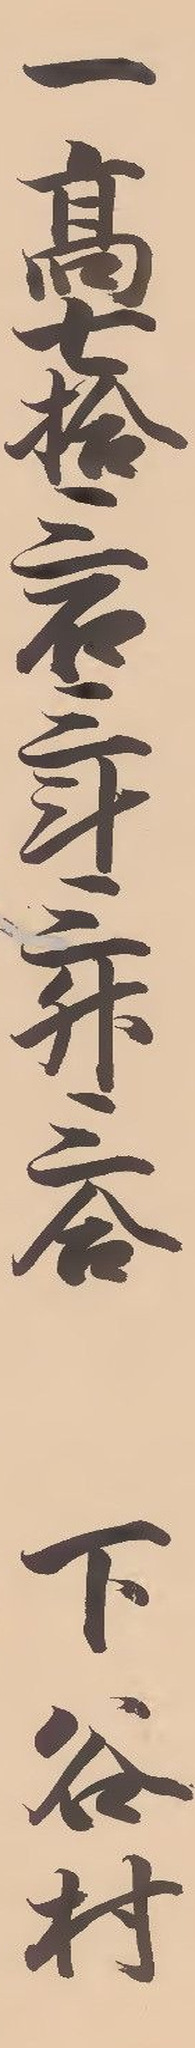一高七拾三石三斗三升三合下谷村
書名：美作国郷帳
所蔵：国立公文書館 National Archives of Japan
